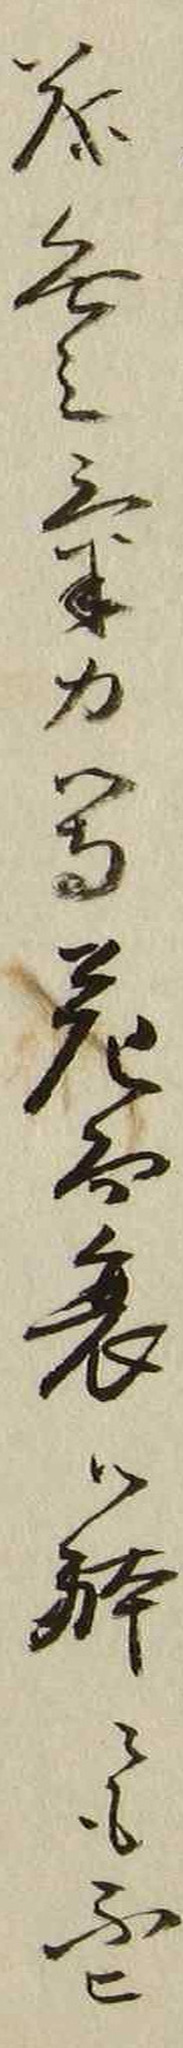も無之気力等差而衰候体にも不被
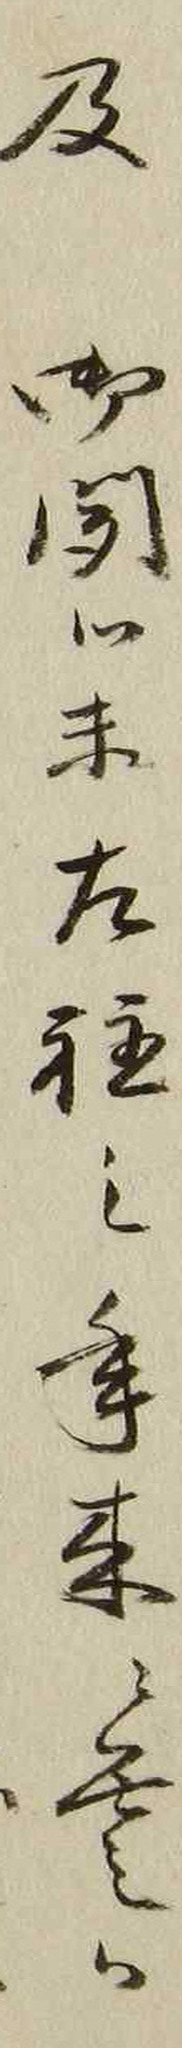及御聞以未左程之年來に無之候
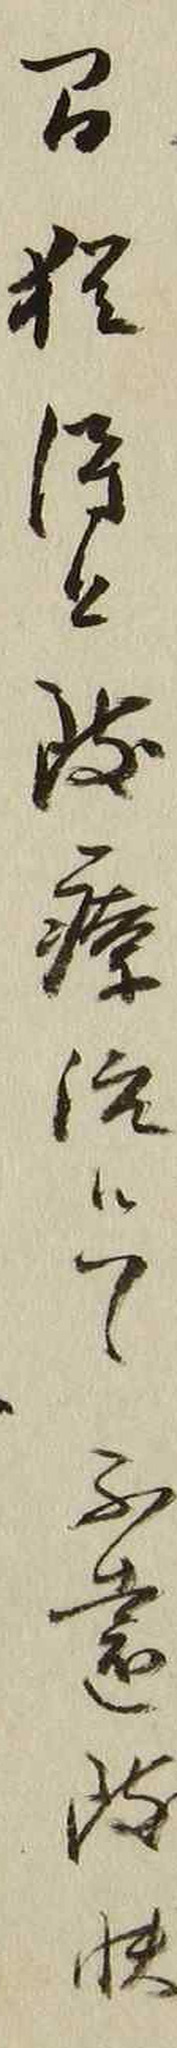間猶得と致療治候はゝ不遠致快
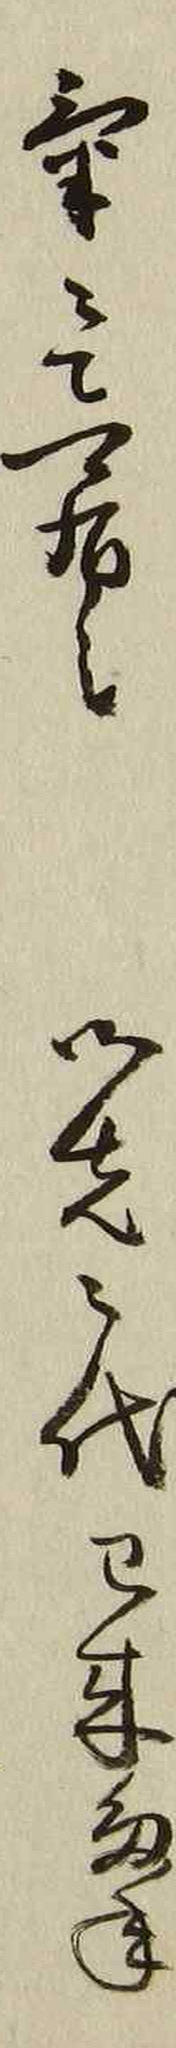気にて可有之御先々代已来多年
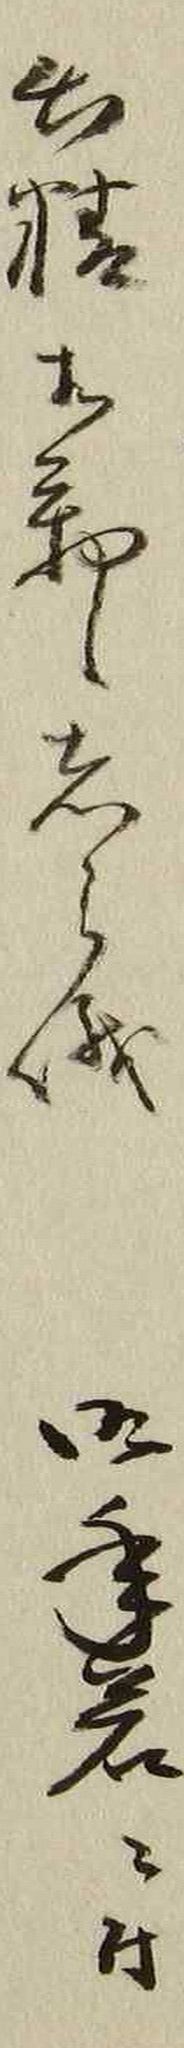出精相勤候者之儀御年若に付
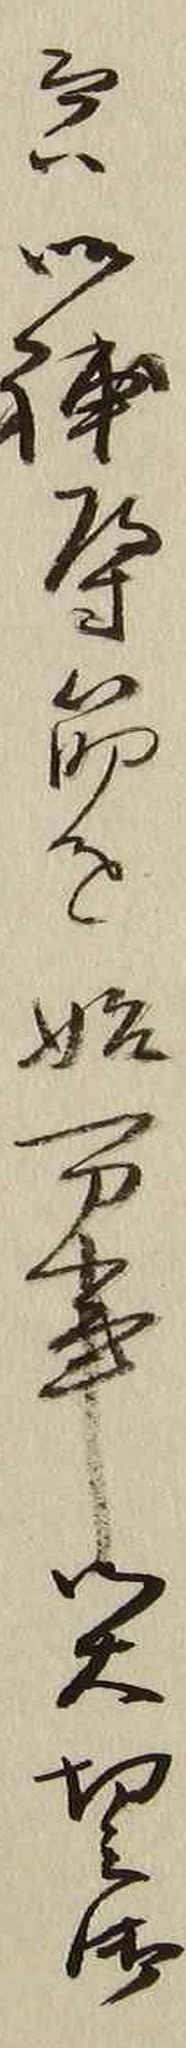而は御補導筋を仕始万事御大切之御
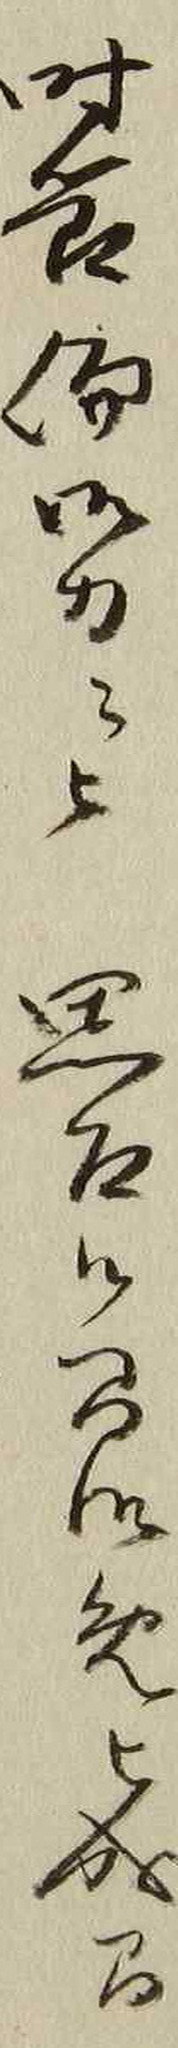時節併御力に被思召候間御免被成間
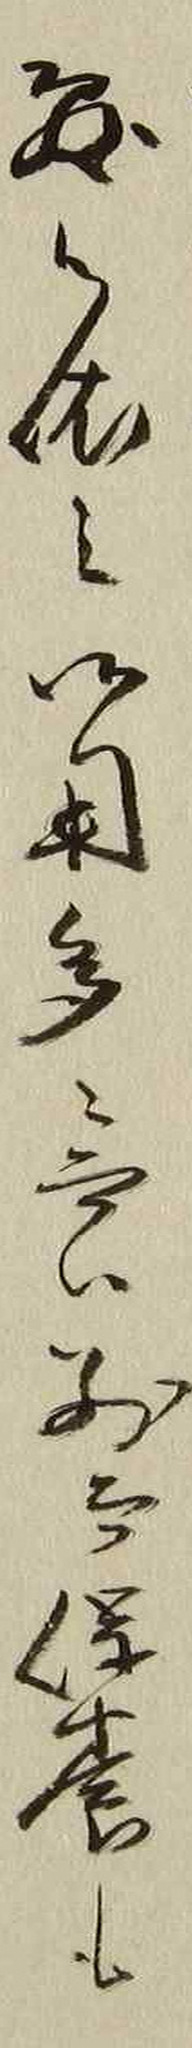敷候依之御用多に而は別而保養も
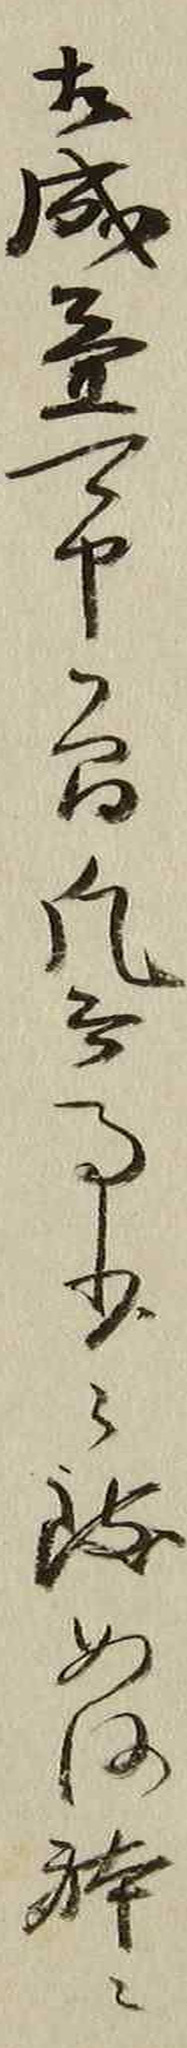相成兼可申候間凡而事少に致如何体に
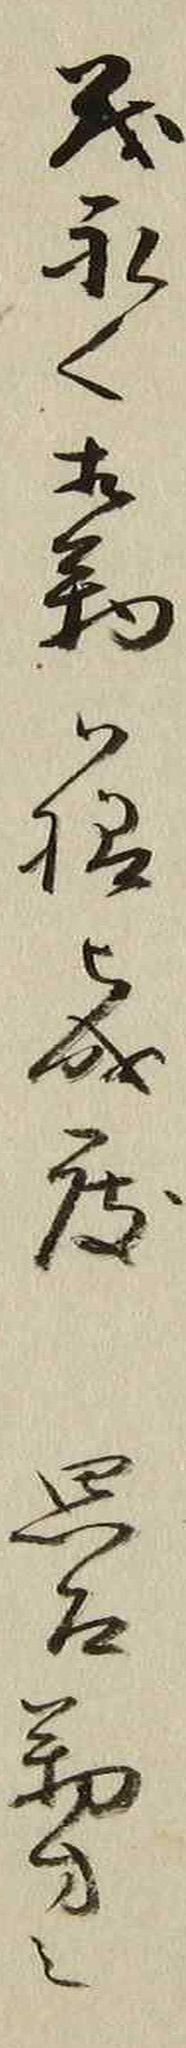も永く相勤候様被成度思召勤方之
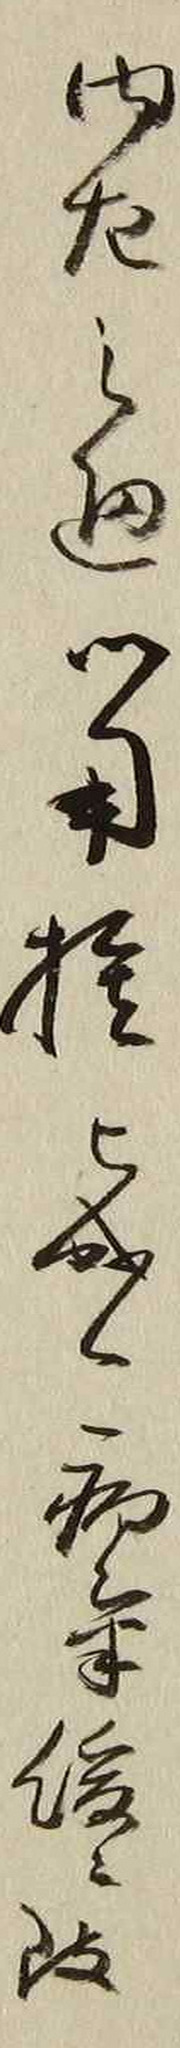内左之通御用捨被成候病気復に致
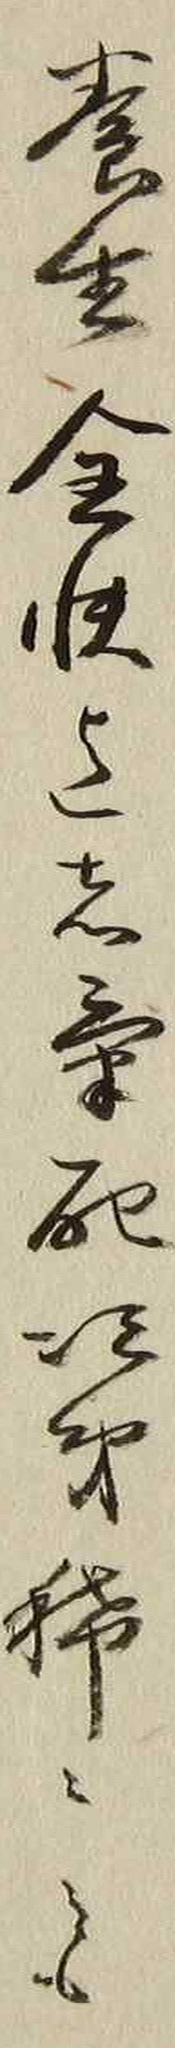養生全快迄は気配次第稀にも
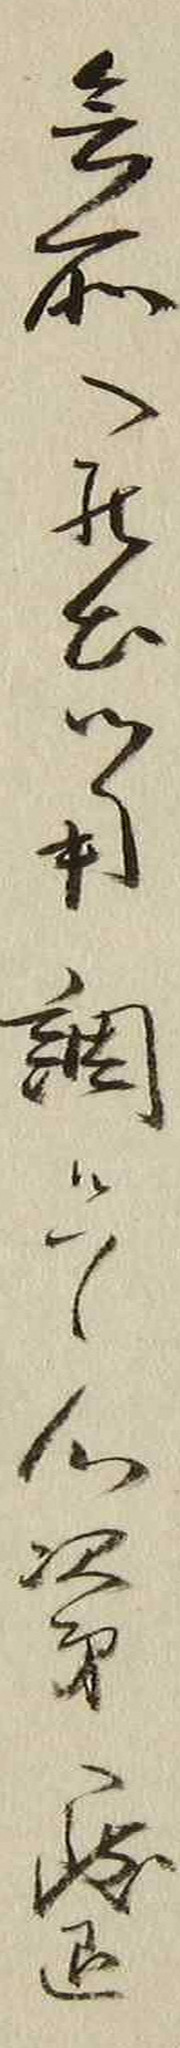会所へ罷出御用調候はゝ心次第致退
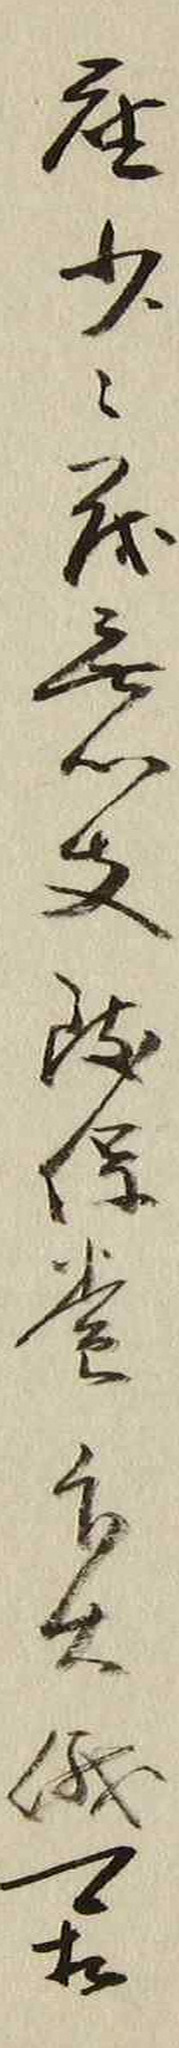座少々も無御支致保養乍大儀可相
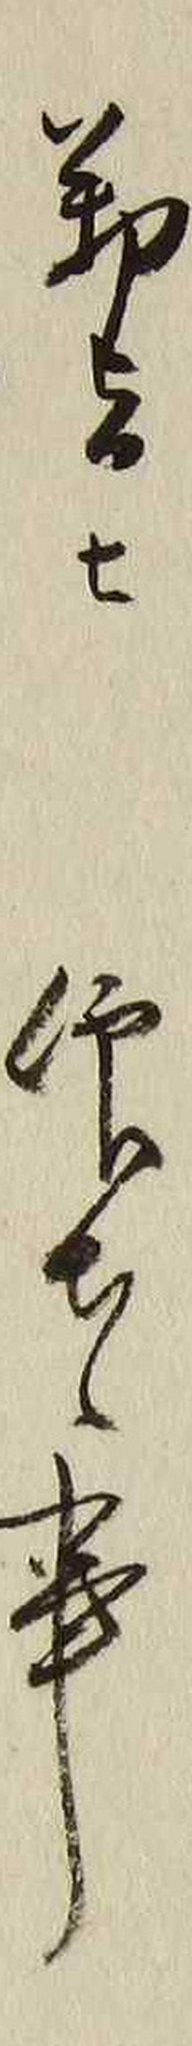勤旨被仰出候事
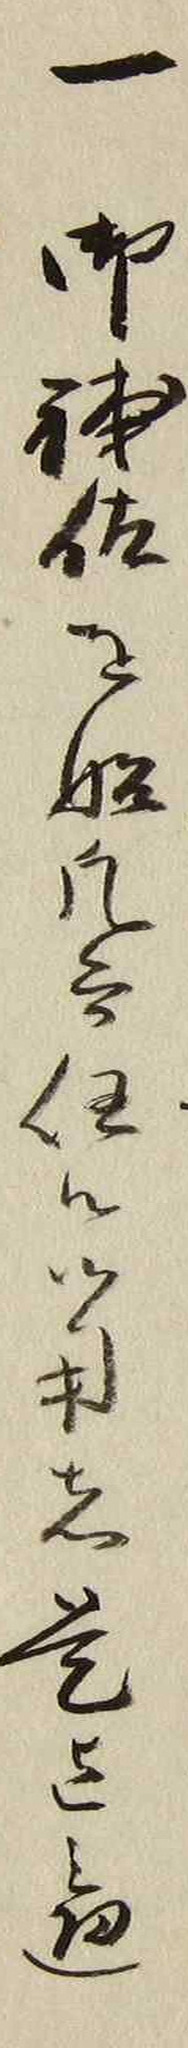一御補佐を始凡而任候御用は是迄之通
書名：諸士系譜　巻之292　き之部1
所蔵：会津若松市立会津図書館
